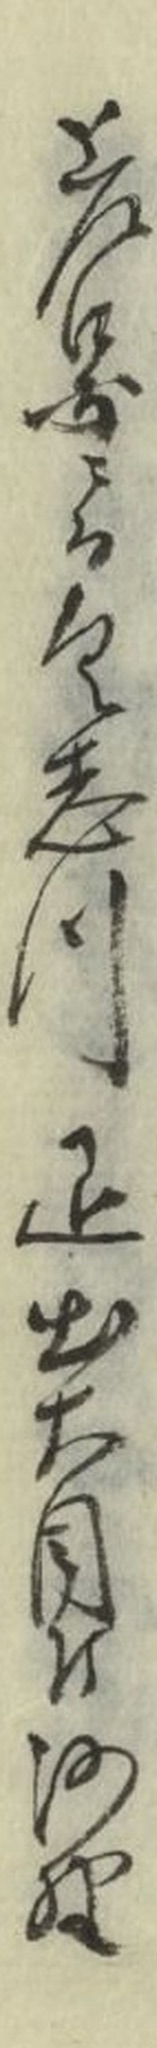差図に而具志川退出大目付河野
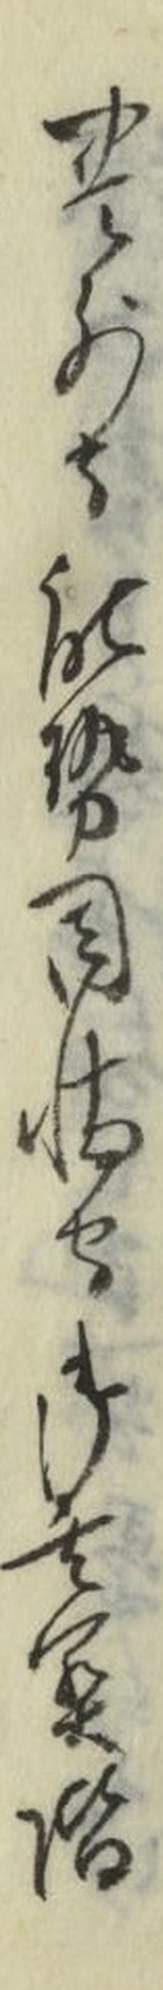豊前守能勢因幡守御玄関階
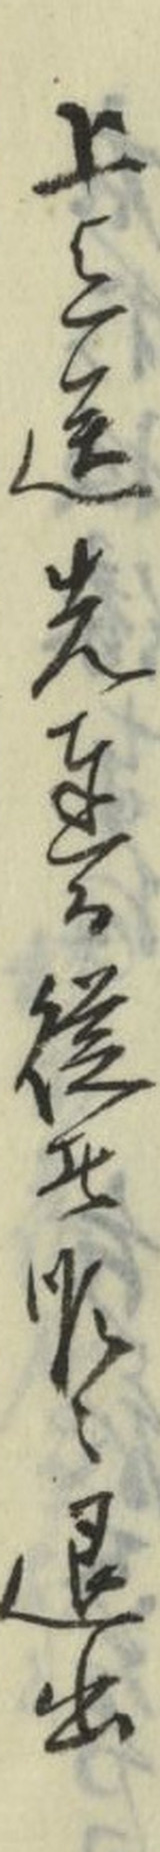上迄送先達而従者順々退出
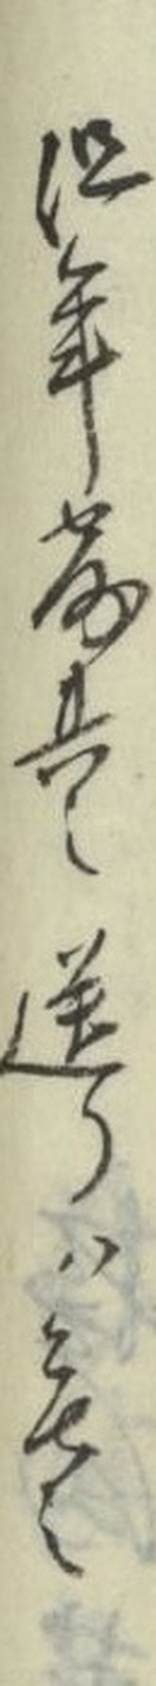但年寄共之送りは無之
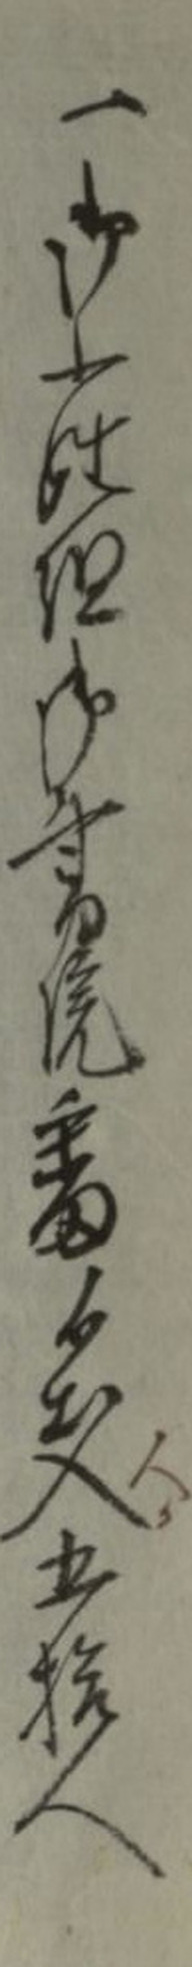一御小姓組御書院番ゟ出入五拾人
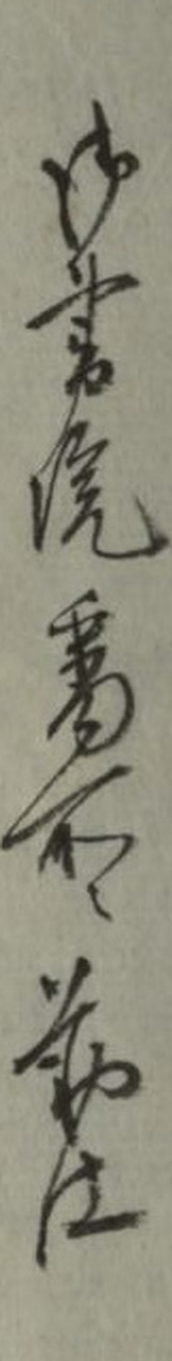御書院番所々勤仕
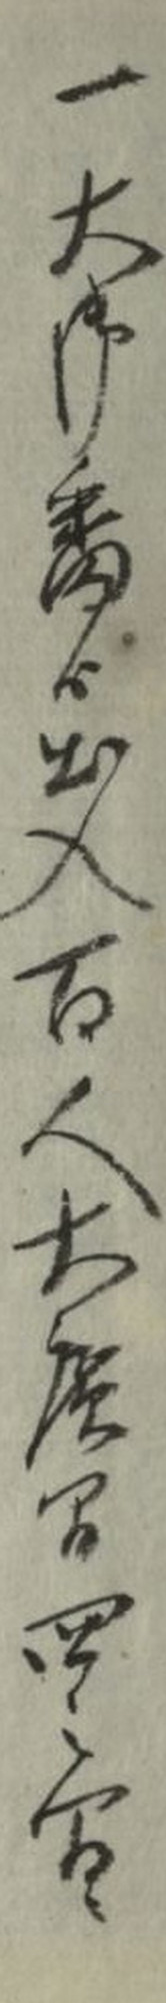一大御番ゟ出入百人大広間四之間に
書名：琉球人来朝記 一之二
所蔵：University of the Ryukyus Library
